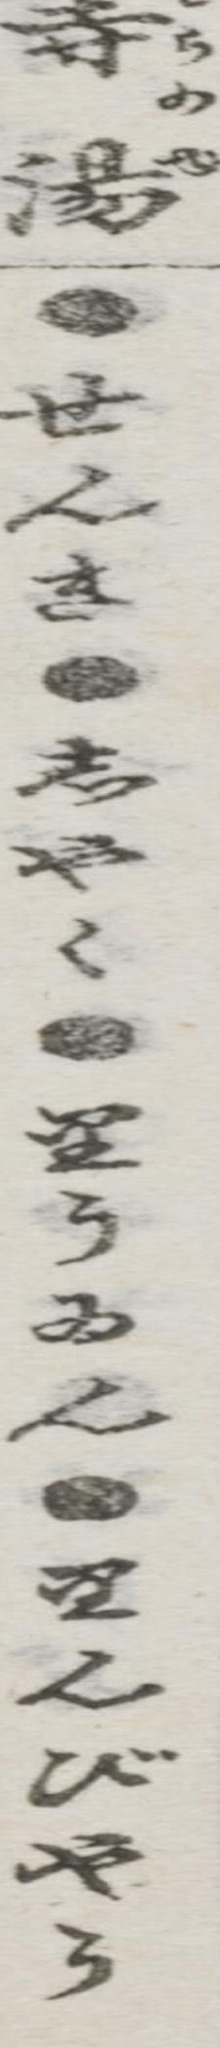同寺湯●せんき●しやく●りうゐん●りんびやう
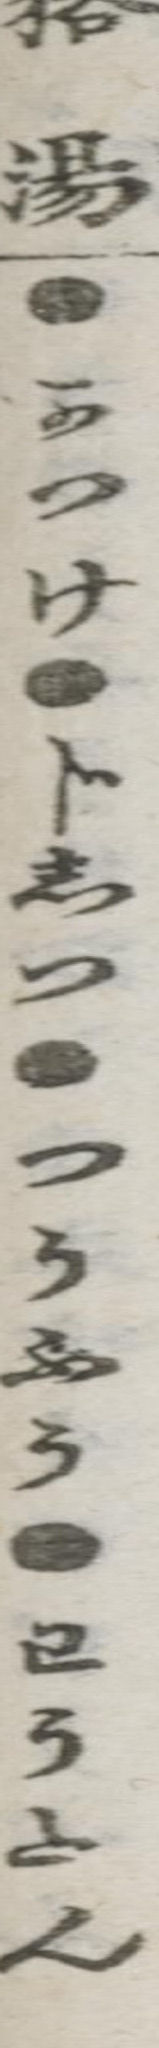貉湯●かつけ●じしつ●つうふう●わうたん
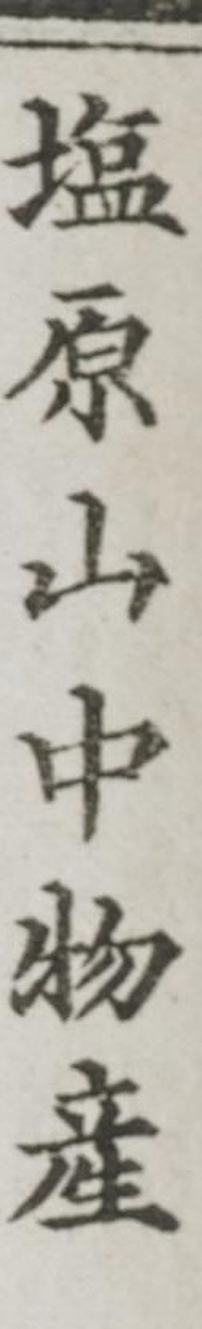塩原山中物産
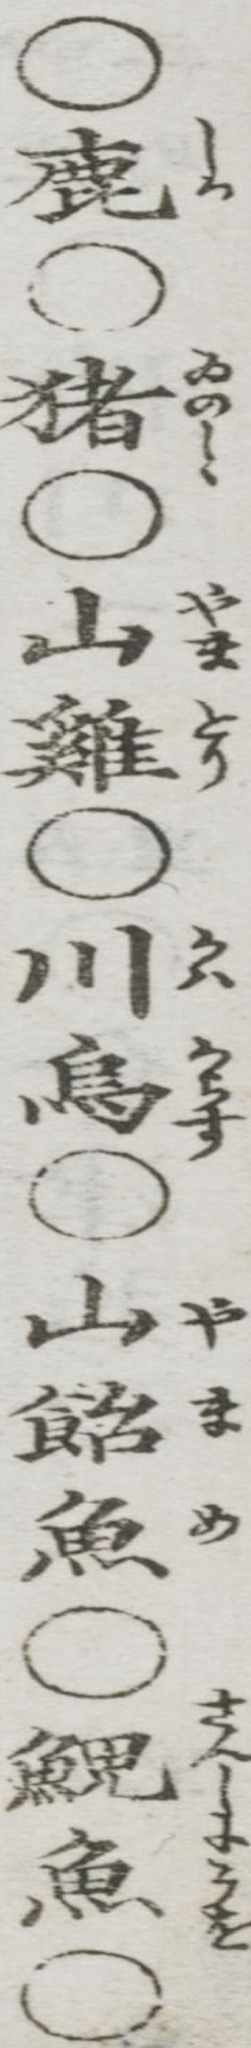○鹿○猪○山雞○川烏○山飴魚○鯢魚○
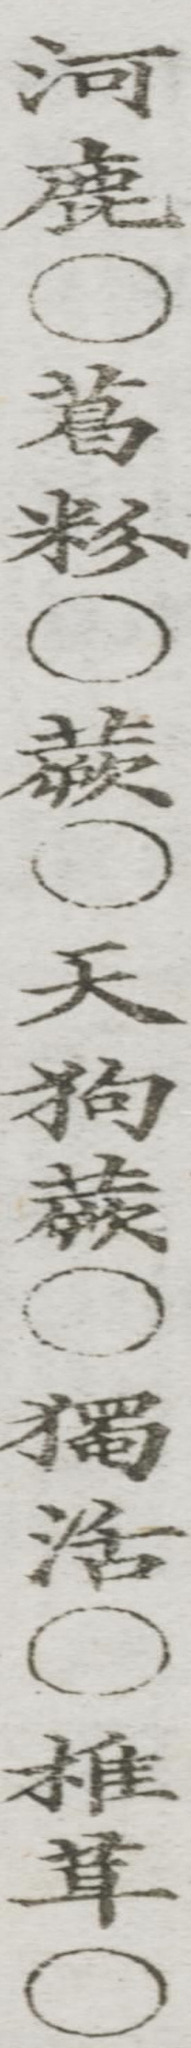河鹿○葛粉○蕨○天狗蕨○獨活○椎茸○
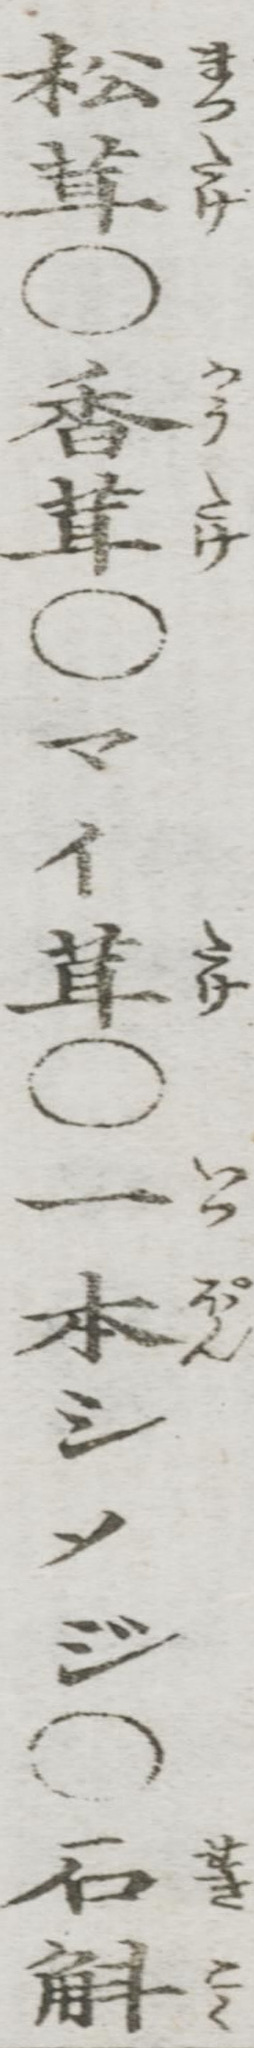松茸○香茸○マイ茸○一本シメジ○石斛
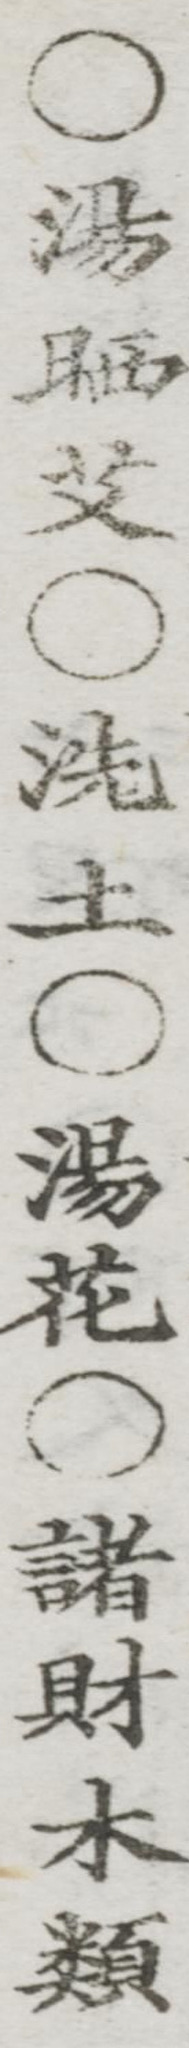○湯晒艾○洗土○湯花○諸財木類
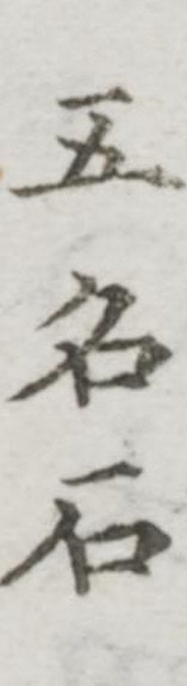五名石
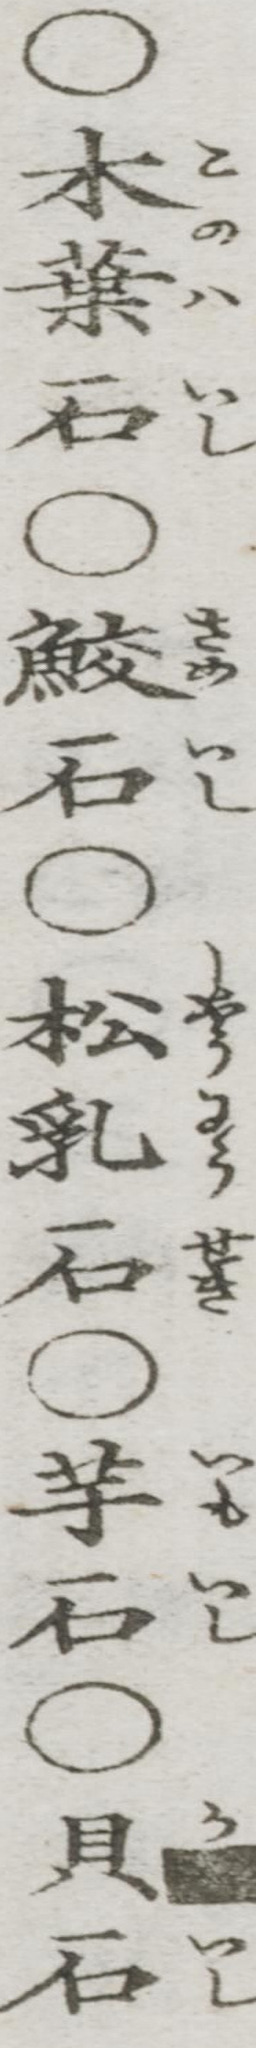○木葉石○鮫石○松乳石○芋石○貝石
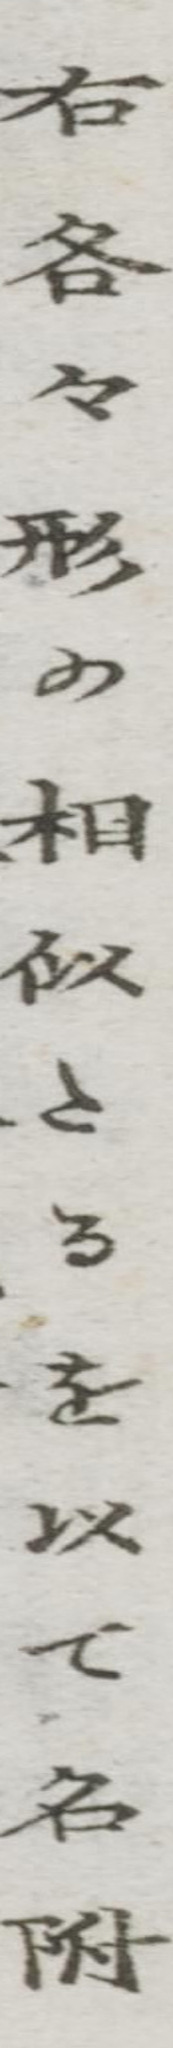右各々形の相似たるを以て名附
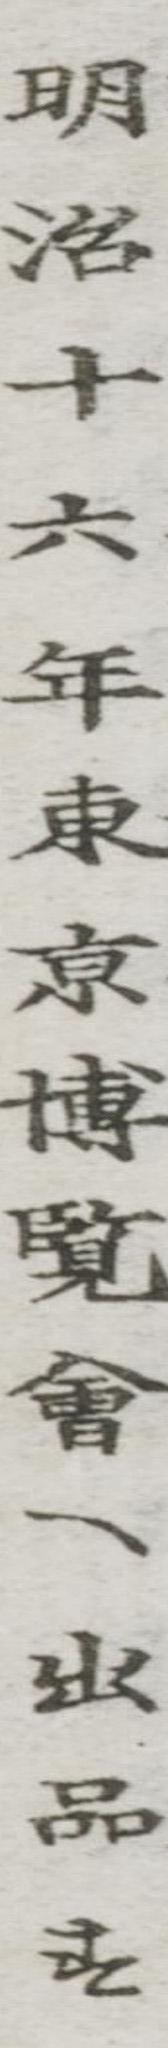明治十六年東京博覧會へ出品す

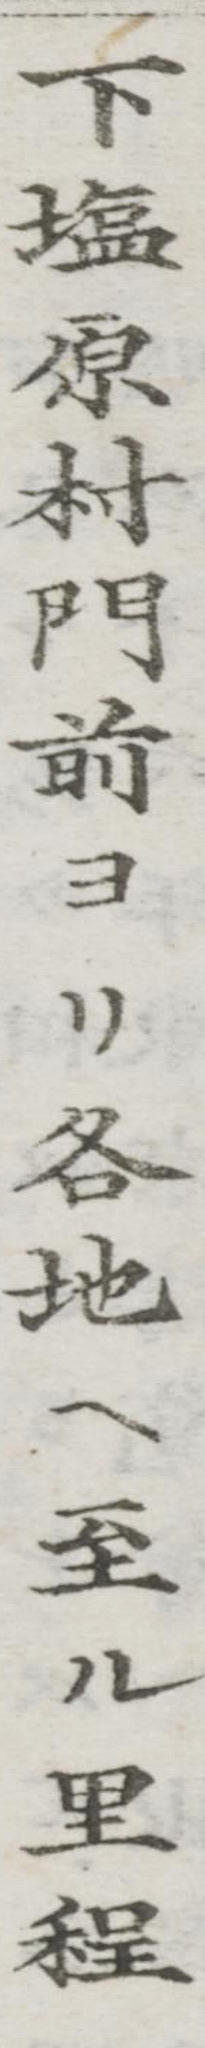下塩原村門前ヨリ各地ヘ至ル里程
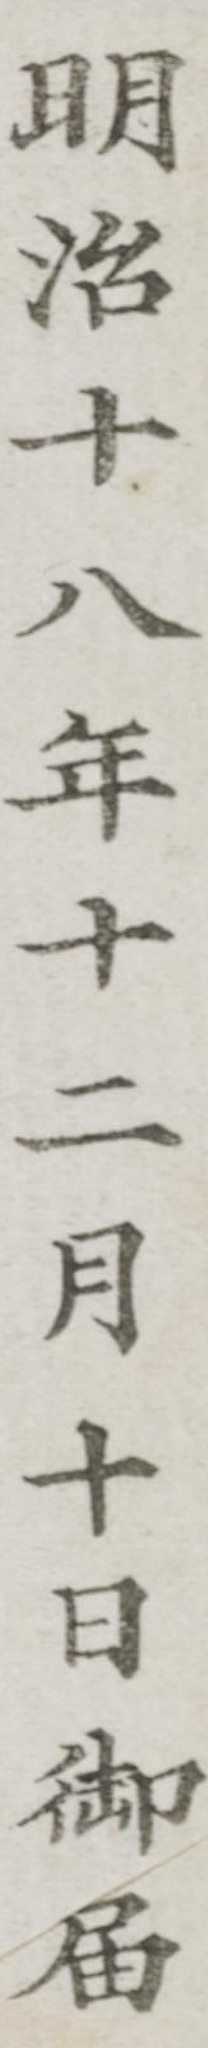明治十八年十二月十日御届
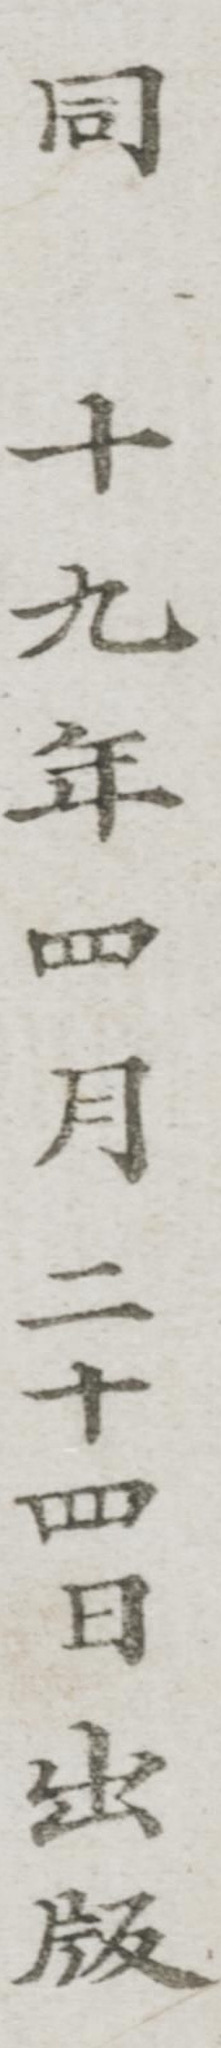同十九年四月二十四日出版
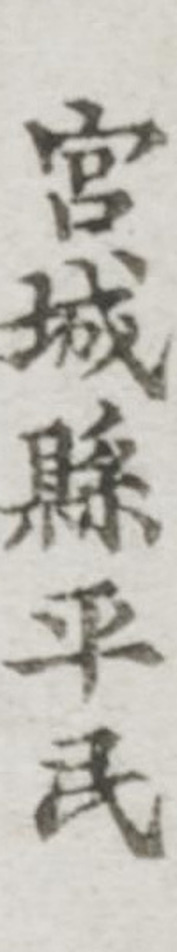宮城縣平民
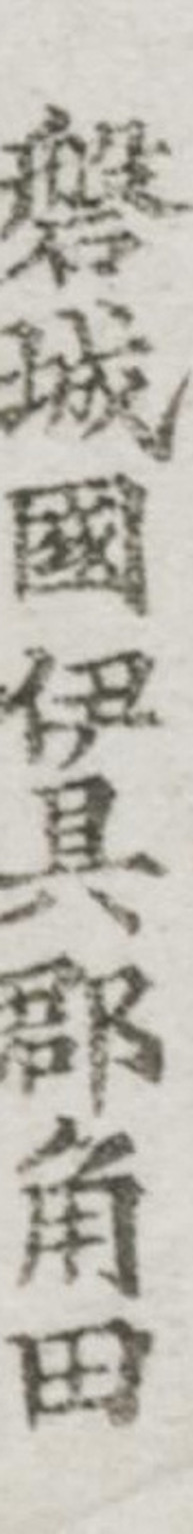磐城國伊具郡角田
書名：塩原繁昌記　全
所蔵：東京大学地震研究所図書室 Earthquake Research Institute Library, The University of Tokyo, JAPAN
